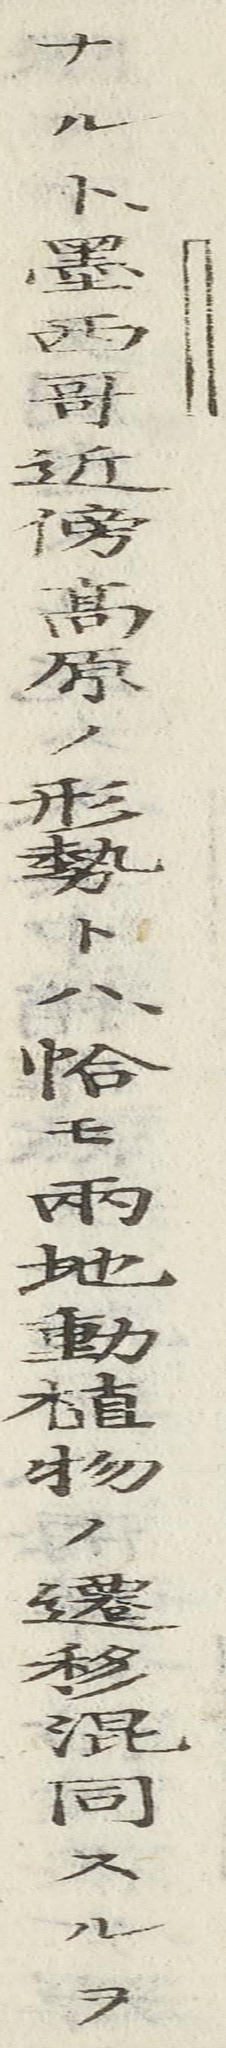ナルト、墨西哥近傍高原ノ形勢トハ、恰モ両地動植物ノ遷移混同スルヲ
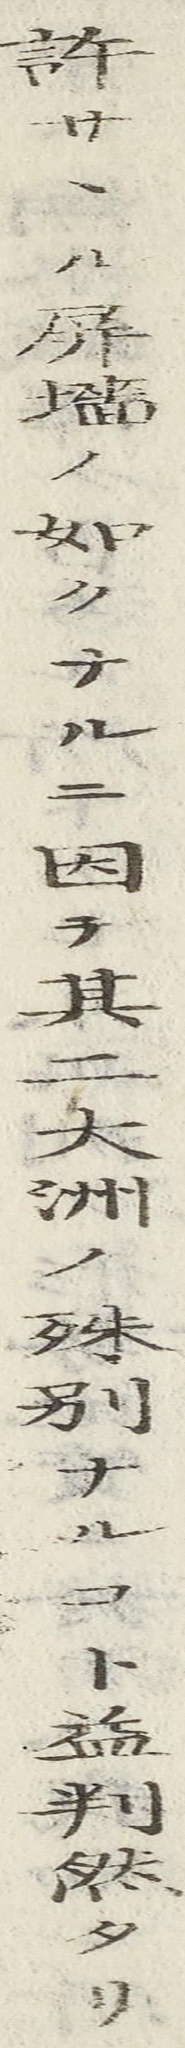許サヽル屏墻ノ如クナルニ因テ其ニ大洲ノ殊別ナルコト益判然タリ
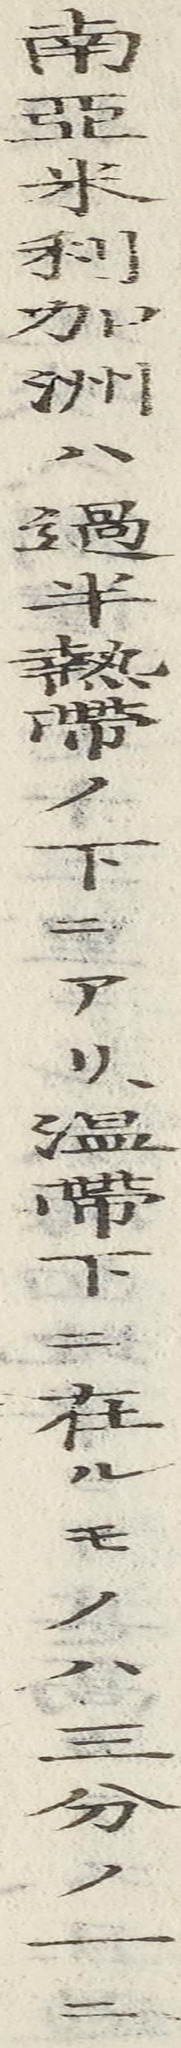南亜米利加洲ハ過半熱帯ノ下ニアリ、温帯下ニ在ルモノハ三分ノ一ニ
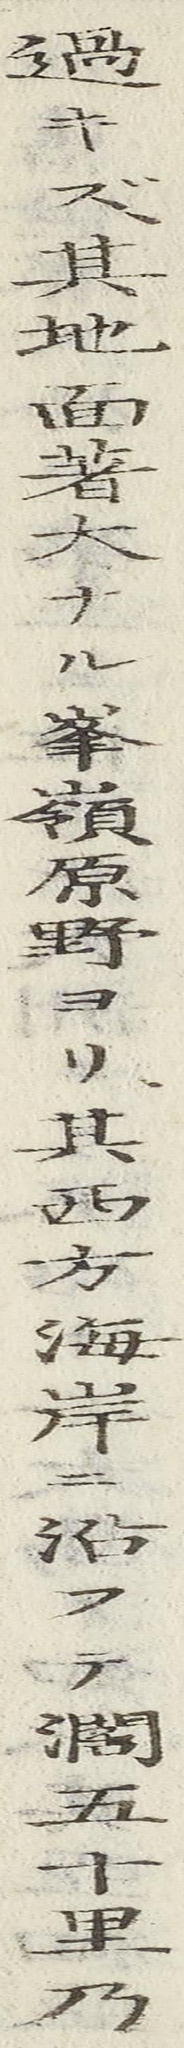過キズ、其地面著大ナル峯嶺原野ヨリ、其西方海岸ニ沿フテ濶五十里乃
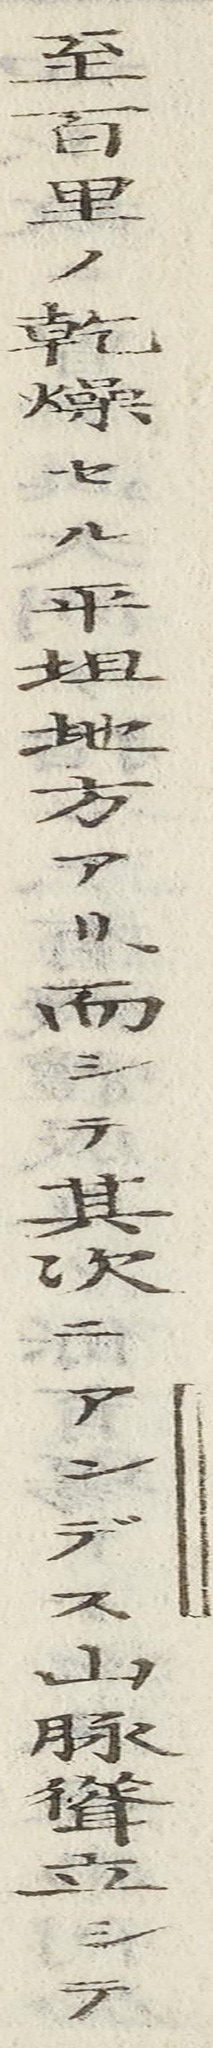至百里ノ乾燥セル平坦地方アリ、而シテ其次ニアンデス山脈聳立シテ
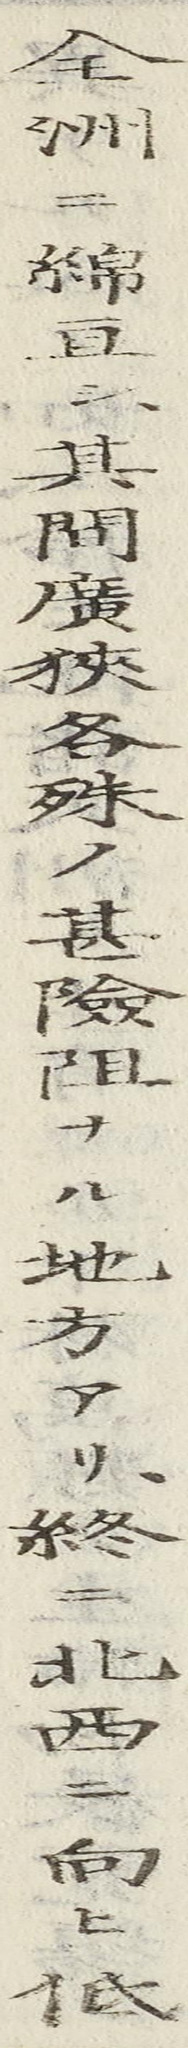全洲ニ綿亘シ、其間広狭各殊ノ甚険阻ナル地方アリ、終ニ北西ニ向ヒ低
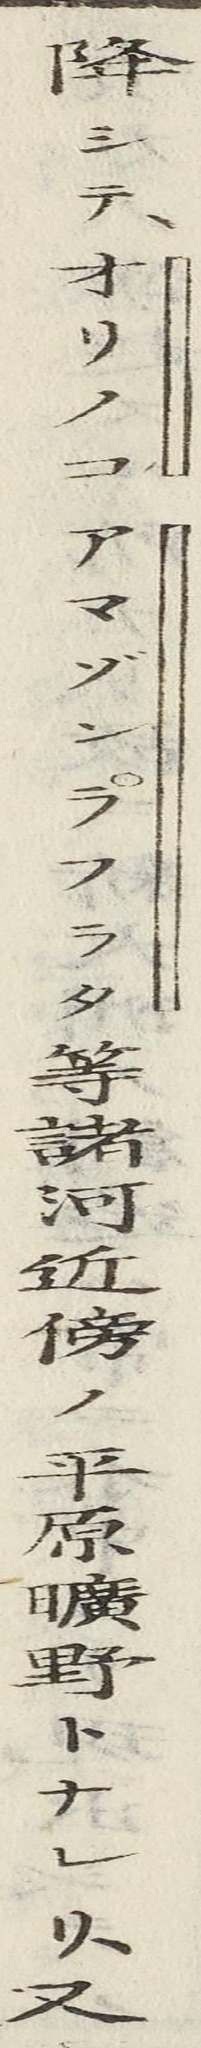降シテ、オリノコアマゾン。ラフラタ等諸河近傍ノ平原嚝野トナレリ、又
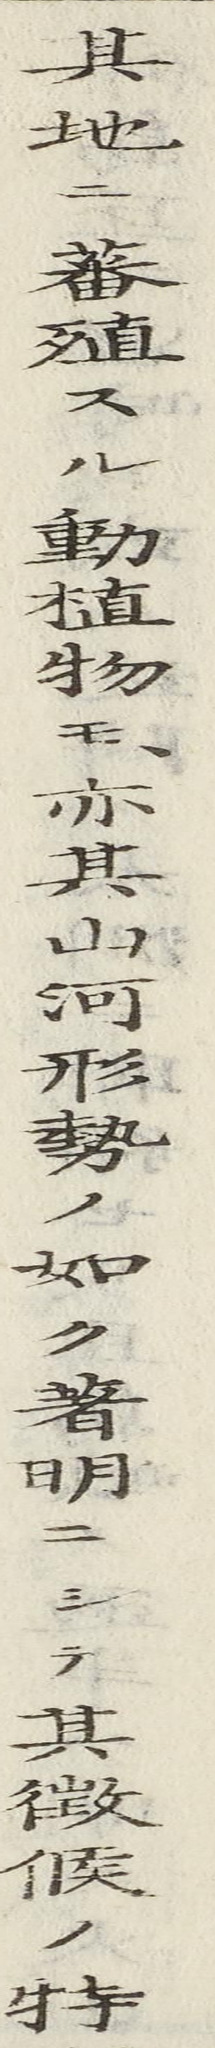其地ニ蕃殖スル動植物モ、亦其山河形勢ノ如ク著明ニシテ其徴候ノ特
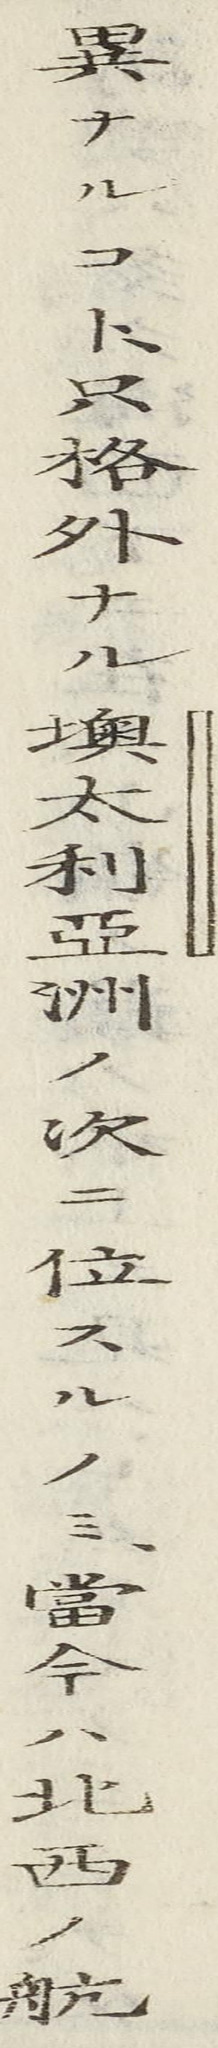異ナルコト、只格別ナル墺太利亜洲ノ次ニ位スルノミ、当今ハ北西ノ航
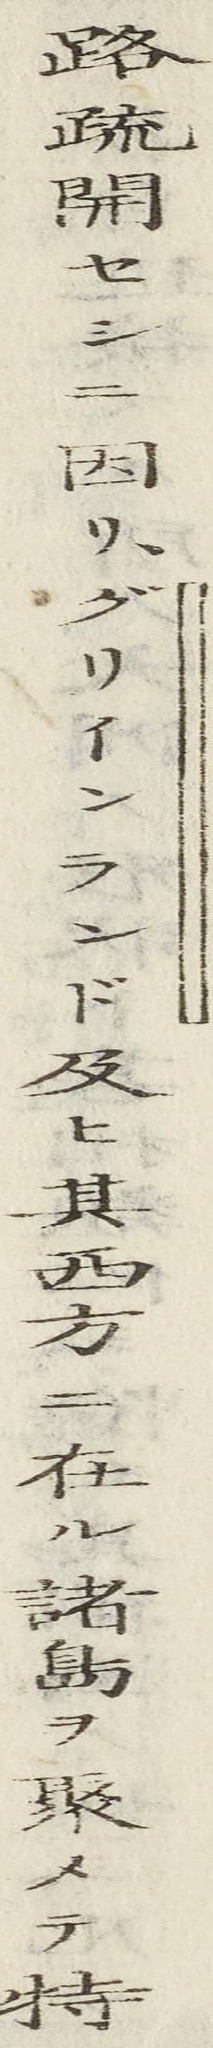路疏開セシニ因テ、グリインランド及ヒ其西方ニ在ル諸島ヲ聚メテ特
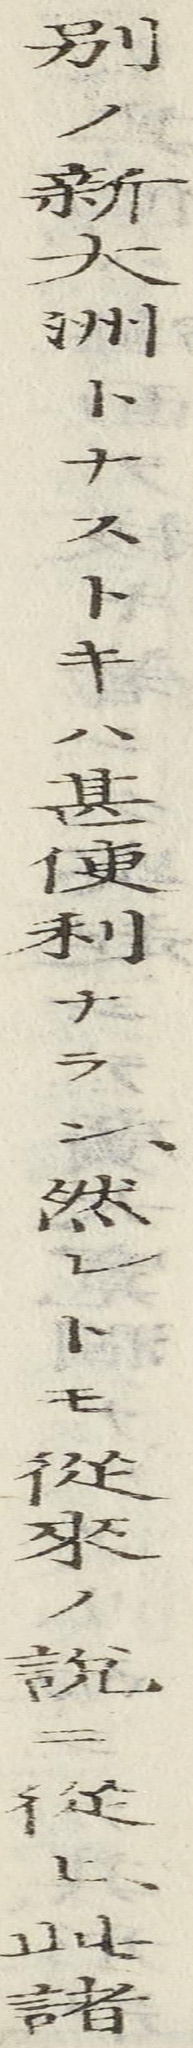別ノ新大洲トナストキハ甚便利ナラン、然レトモ従来ノ説ニ従ヒ、此諸
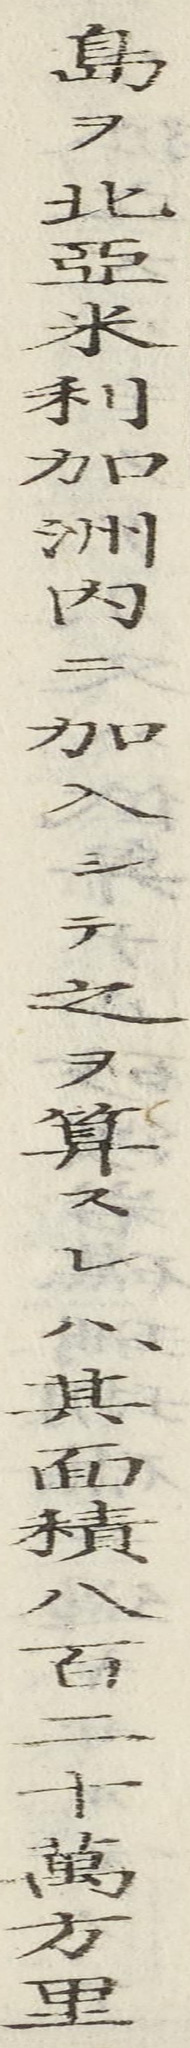島ヲ北亜米利加洲内ニ加入シテ之ヲ算スレハ、其面積八百二十万方里
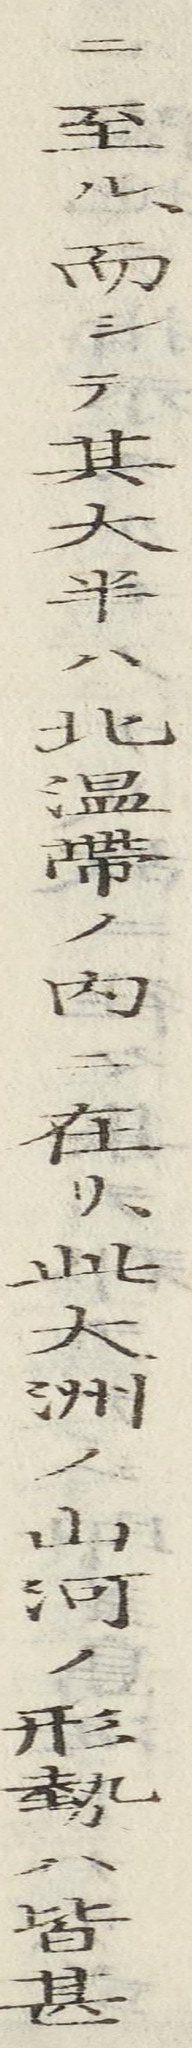ニ至ル、而シテ其大半ハ北温帯ノ内ニ在リ、此大洲ノ山河ノ形勢ハ皆甚
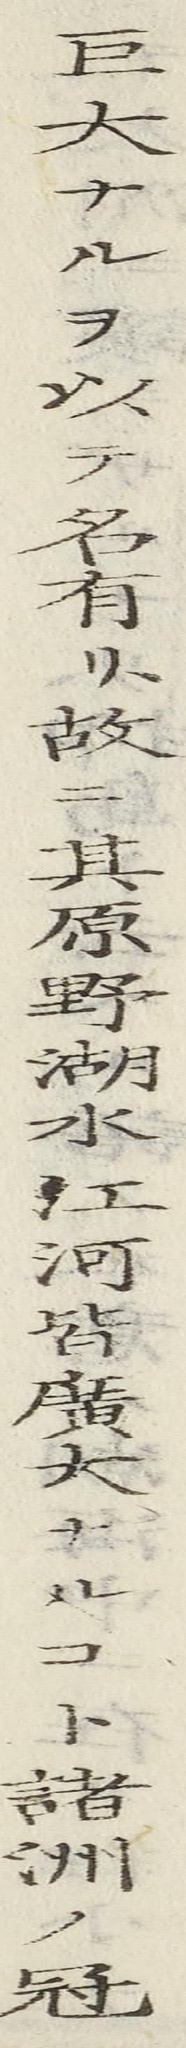巨大ナルヲ以テ名有リ、故ニ其原野湖水江河皆広大ナルコト諸洲ノ冠
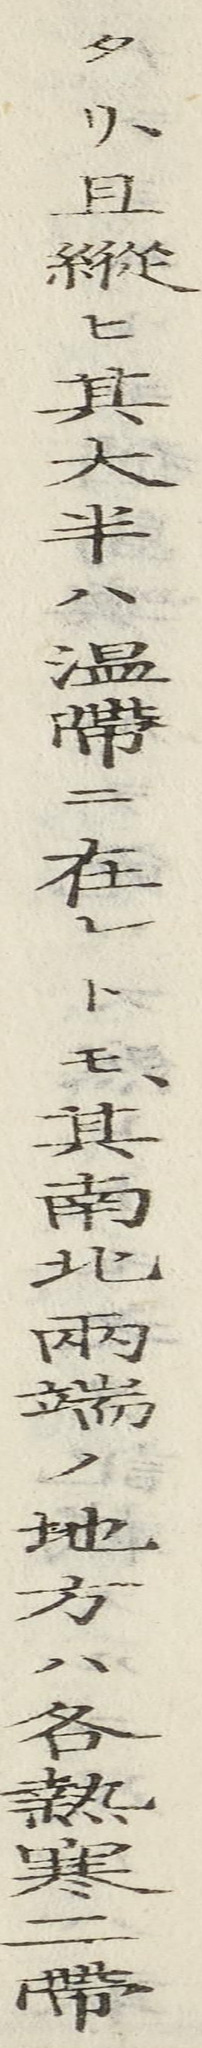タリ、且縦ヒ其大半ハ温帯ニ在レトモ、其南北両端ノ地方ハ各熱寒ニ帯
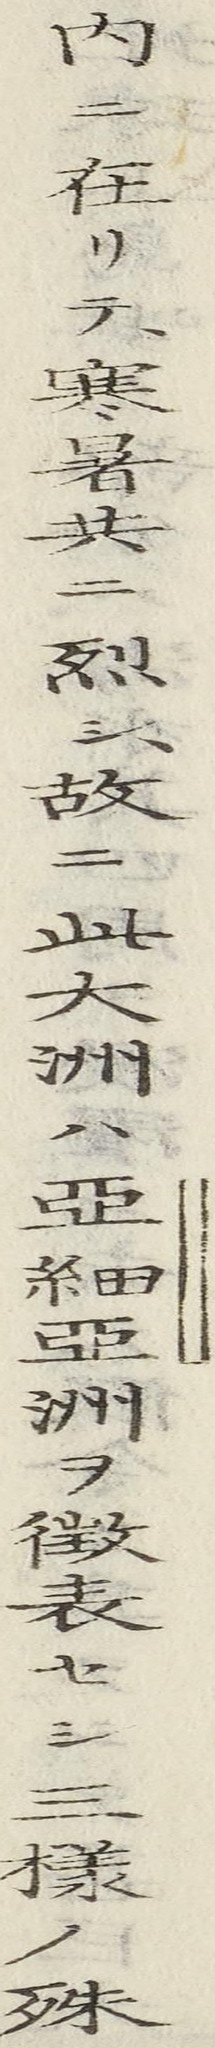内ニ在リテ、寒暑共ニ烈シ、故ニ此大洲ハ亜細亜洲ヲ徴表セシ三様ノ殊
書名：百科全書　地文學　全
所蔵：東京大学地震研究所図書室 Earthquake Research Institute Library, The University of Tokyo, JAPAN
